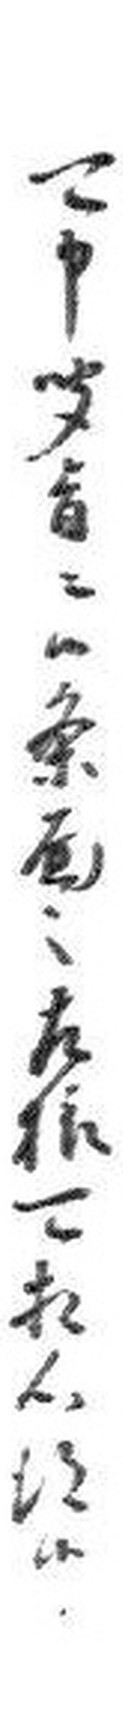可申聞旨ニ候条面々左様可相心得候
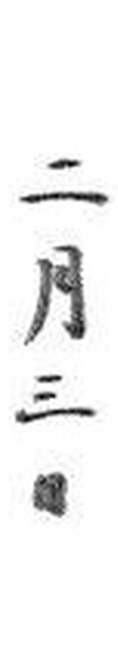二月三日
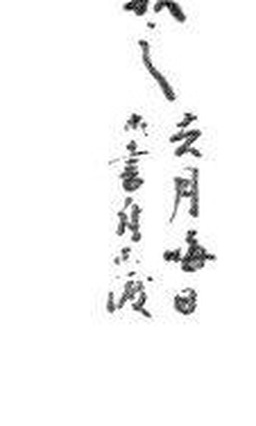御書付御渡

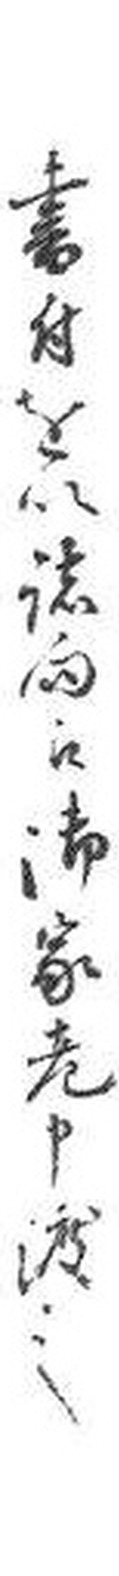書付を以諸向江御家老申渡之
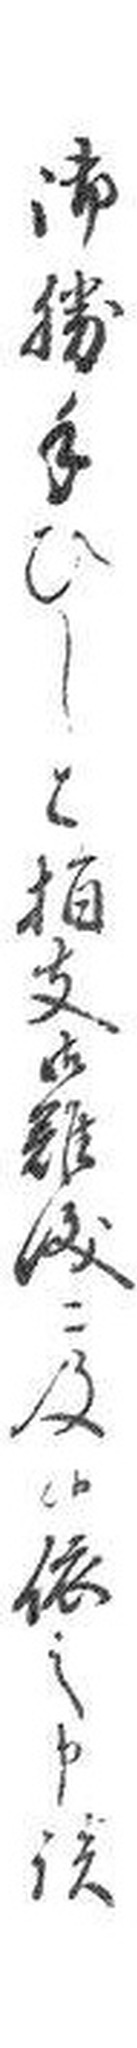御勝手ひしと指支御難儀ニ及候依之申談
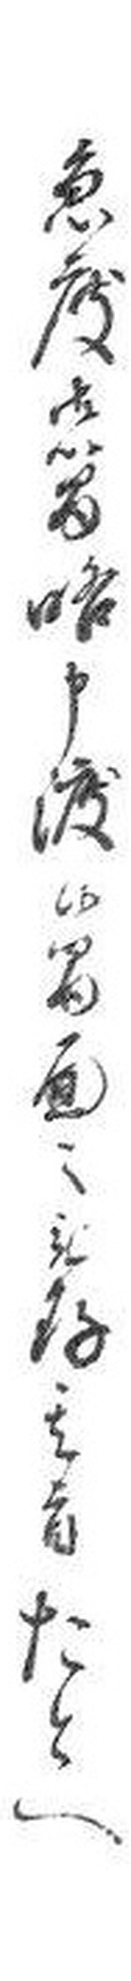急度御簡略申渡候間面々被存其旨たとへ
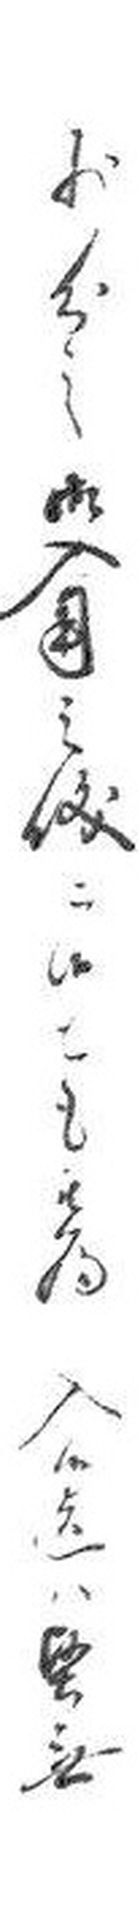少分之御入用之儀ニ候とも被為入候迄ハ堅無
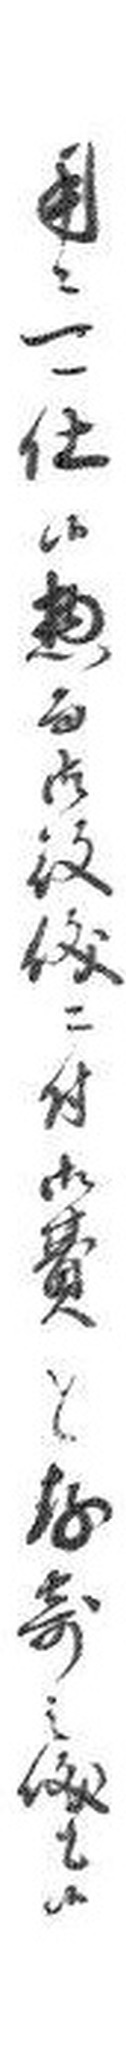用ニ可仕候惣而御役儀ニ付御費と存寄之儀も候
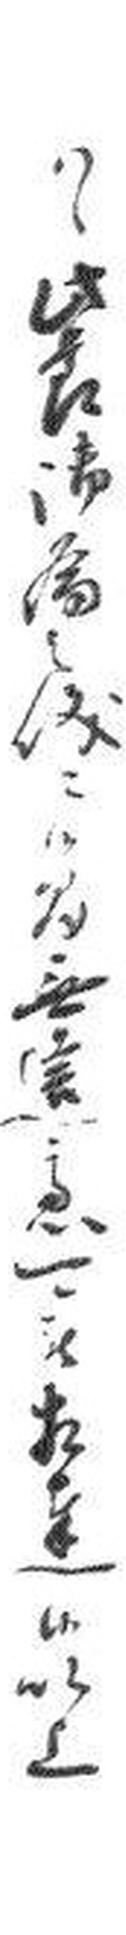ハヽ此節御為之儀ニ候間無遠慮可被相達候以上
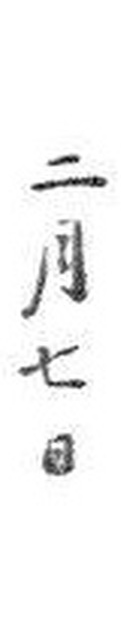二月七日
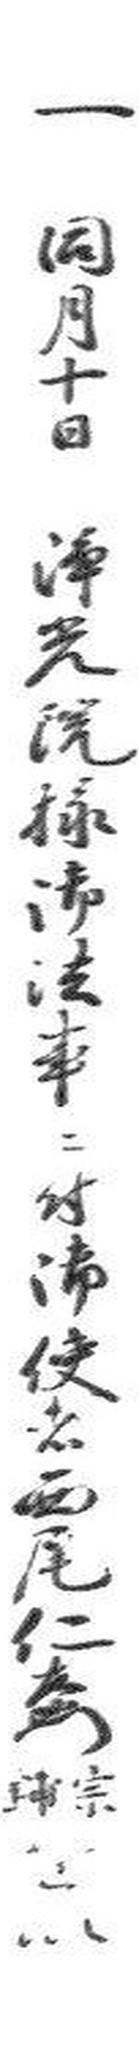一同月十日浄光院様御法事ニ付御使者西尾仁左衛門宗鋪を以
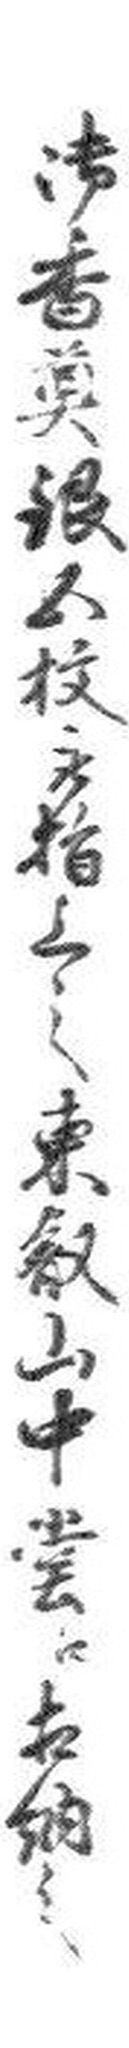御香奠銀五枚被指上之東叡山中堂江相納之
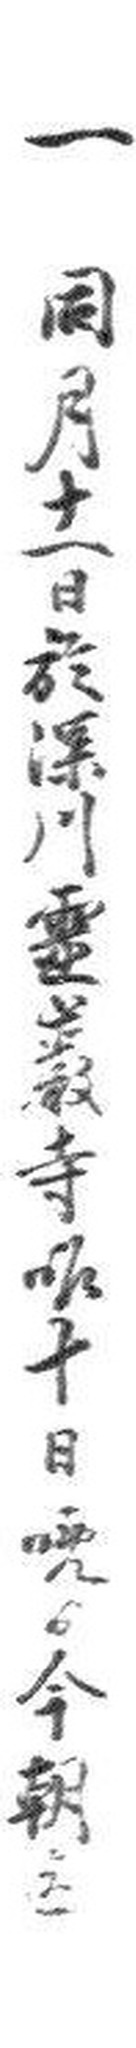一同月十一日於深川霊巌寺昨十日晩ゟ今朝迄
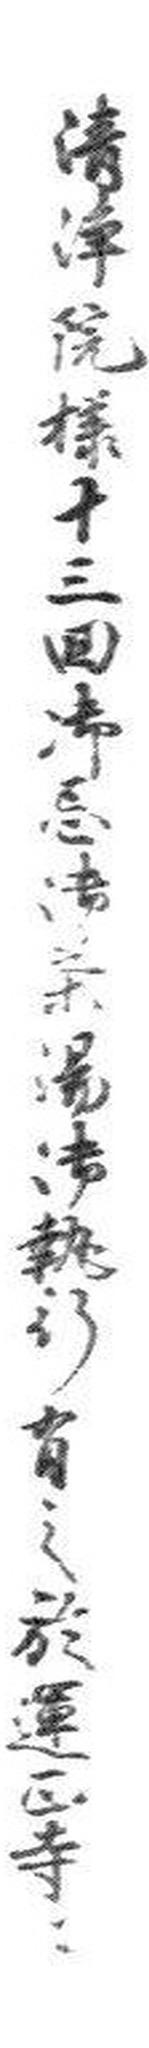清浄院様十三回御忌御茶湯御執行有之於運正寺ニ
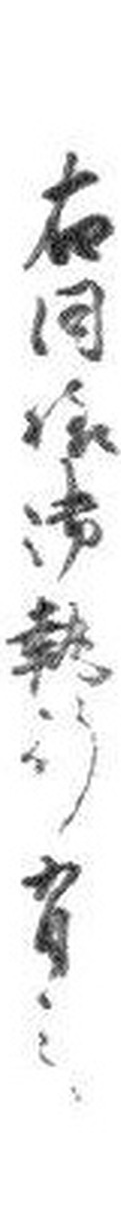右同様御執行有之
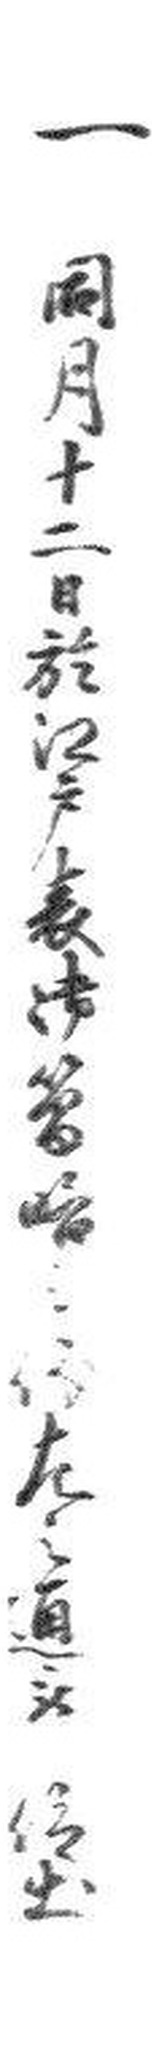一同月十二日於江戸表御簡略之儀左之通被仰出
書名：家譜 二十八 吉邦公 従宝永七年七月五日到正徳元年十二月
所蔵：福井県文書館 Fukui Prefectural Archives
